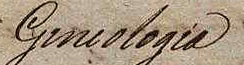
Geneologia
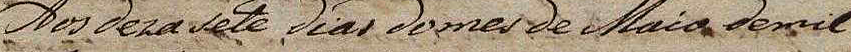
Aos dezasete dias do mes de Maio de mil
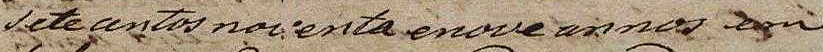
setecentos noventa e nove annos em
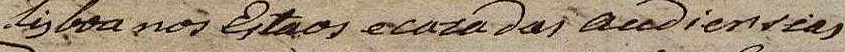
Lisboa nos Estaos e caza das audiensias
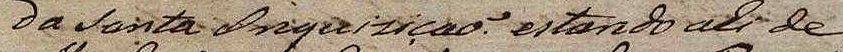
da santa Inquiziçaõ estando ahi de
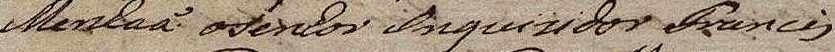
Menhaã o senhor Inquizidor Francis
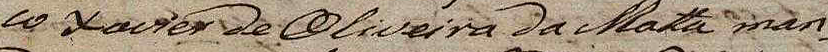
co Xavier de Oliveira da Matta man
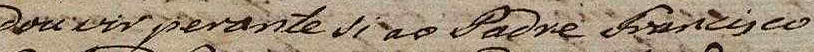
dou vir perante si ao Padre Francisco
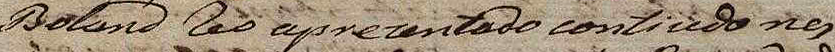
Boland Reo aprezentado contiudo nes
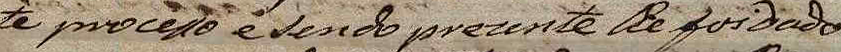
te processo e sendo prezente lhe foi dado
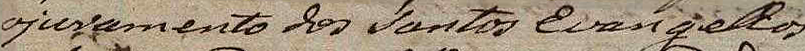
o juramento dos santos Evangelhos
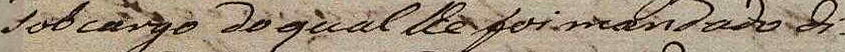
sob cargo do qual lhe foi mandado di
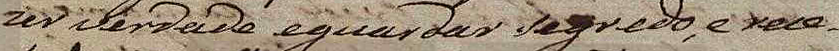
zer verdade e guardar segredo, e rece
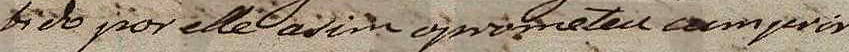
bido por elle asim o prometeu cumprir
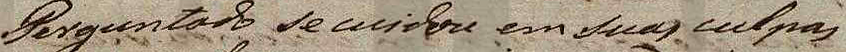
Perguntado se cuidou em suas culpas
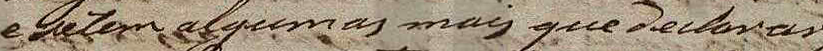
e se tem algumas mais que declarar
